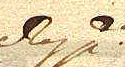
Resp.ta
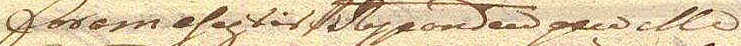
forem asestir ? Respondeu que elle
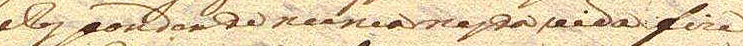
Respondente nunca nesta vida fize
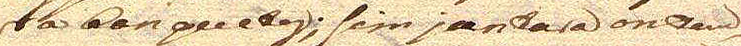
ra banquetes; sim jantara ontem
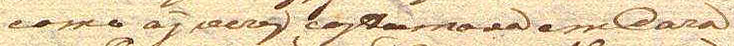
como as vezes costumava em caza
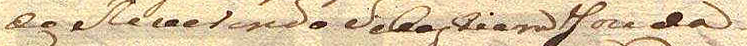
do Reverendo Sebastiam Joze da
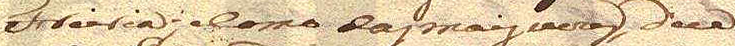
Freiria- e como das mais vezes, dice
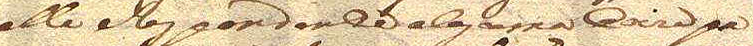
elle Respondente alguma coiza pa
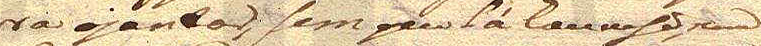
ra o jantar, sem que lá comese, nem
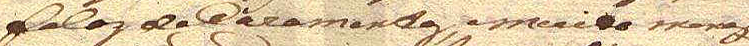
falaz de Cazamentos, e muito menos
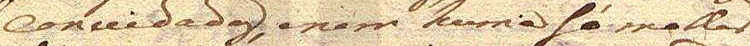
convidados, e nem huma só molher
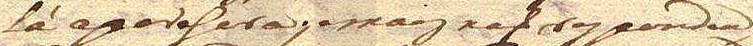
lá aparesera; mais naꝭ respondem
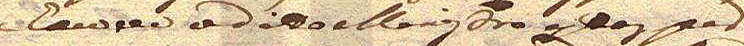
chamouce o dito Menistro estas par
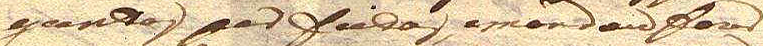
guntas por feitas, e mandou fazer
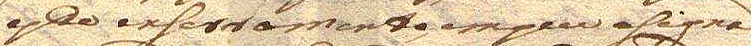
este enserramento, em que asigna
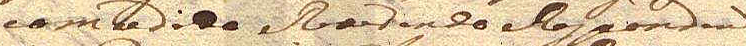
com o dito Reverendo Responde
